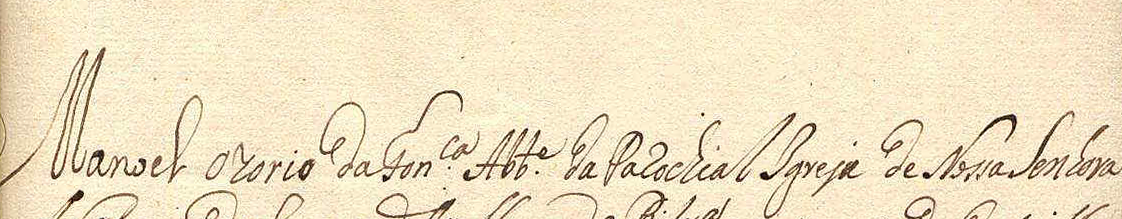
Manoel Ozorio da Fon.ca Abb̄.e da Pahochial Igreja de Nossa Senhora
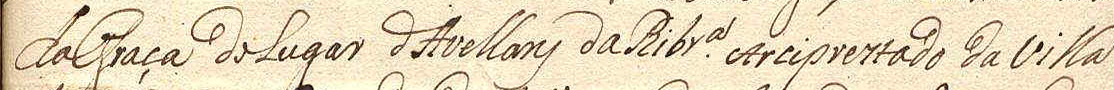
da Praça do Lugar d'Avellans da Ribr.a Arciprestado da villa
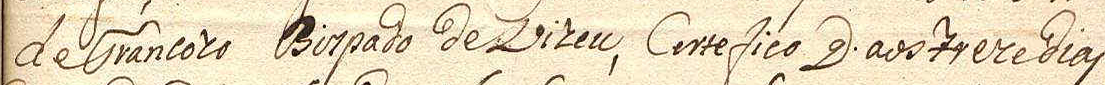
de Trancozo Bispado de Vizeu, Certefico q̄ aos treze dias
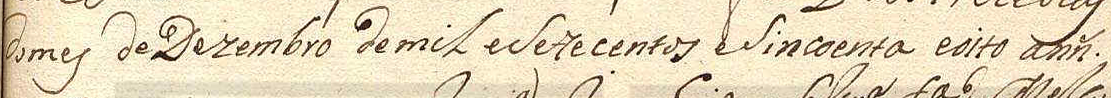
do mes de Dezembro de mil e Setecentos e Sincoenta e oito ann.s
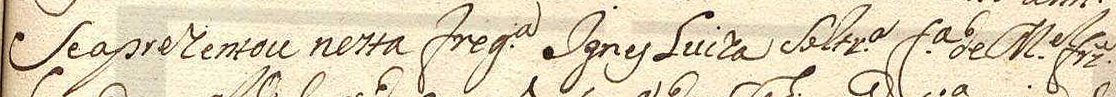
se aprezentou nesta freg.a Ignes Luiza Soltr.a f.a de M.el frz̄.
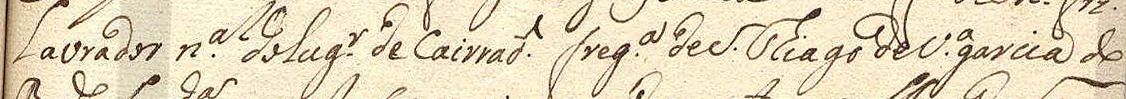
Lavrador n.al do Lug.r de Cairraõ. freg.a de S. Thiago de V.a garcia do
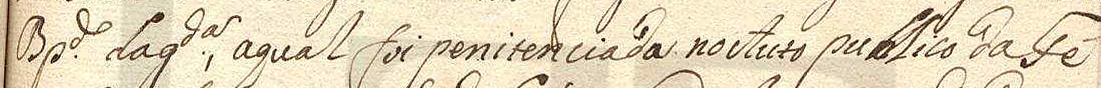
Bp.do da g.da, a qual foi penitenciada no Auto publico da Fé
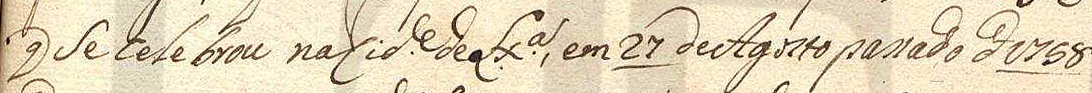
q̄ se celebrou na Cid.e de Lx.a, em 27 de Agosto passado d̄ 1758
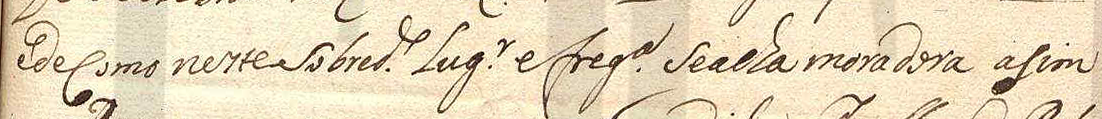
e de Como neste sobred.o Lug.r e freg.a se acha moradora asim
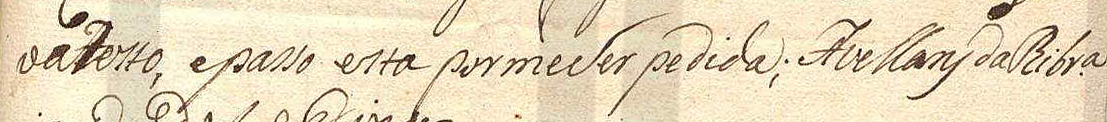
o atesto, e passo esta por me ser pedida; Avellans da Ribr.a
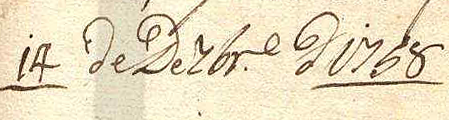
i4 de Dezbr.o d̄ i758
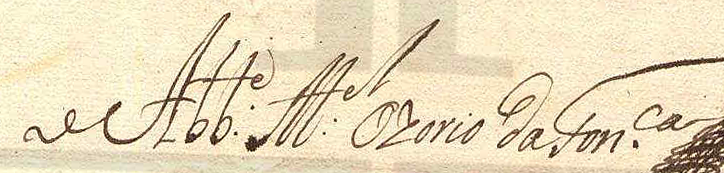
o Abb̄.e M.el Ozorio da Fon.ca
